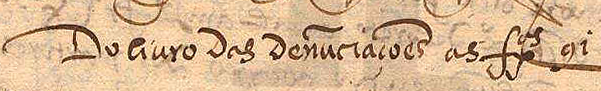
Do liuro das denūciações as fꝭas 9i
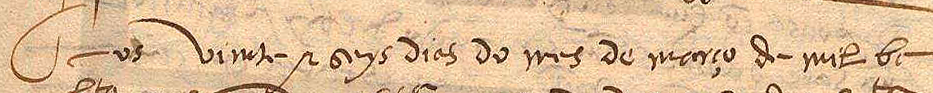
Aos vimte e seys dias do mes de março de miL bc
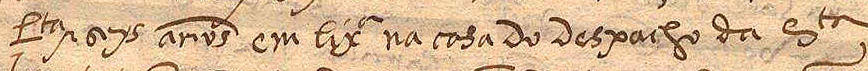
Lta e seys ānos em lixa na casa do despacho da Sta
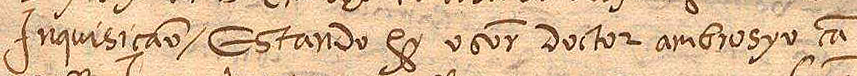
Jnquisição / Estando hy o so̅r doctor ambrosyo c̄a
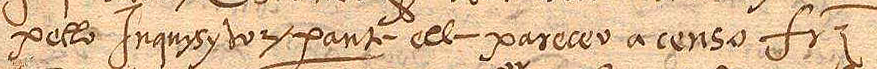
pello Jnquysydor / ꝑante elle pareceo acenso frz̄
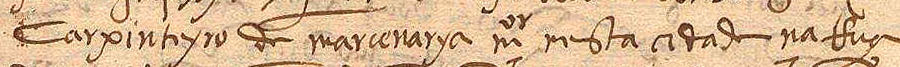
Carpinteyro de marcenarya mor nesta cidade na Rua
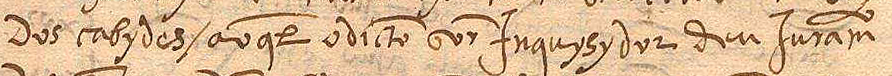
Dos cabydes / ao q̄L o dīcto sōr Jnquysydor deu Juramto
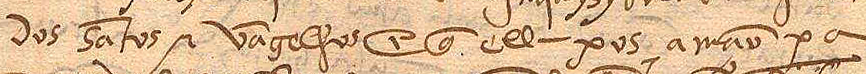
dos Sātos evāgelhos ē q̄ elle pos a mão ꝑa
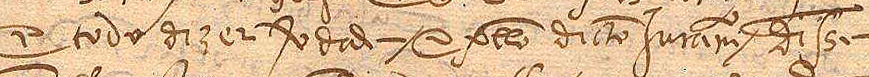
ē todo dizer ꝟdade / e p̄llo dic̄to Juramto / disse
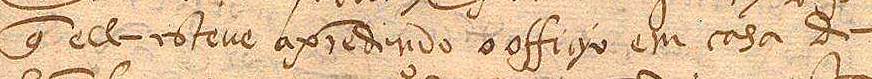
q̄ elle esteue apr̄edendo o officyo em casa de
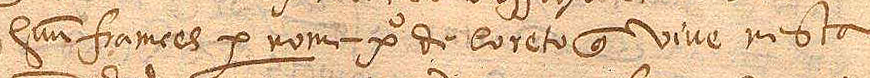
huū framces ꝑ nome po de loreto q̄ viue nesta
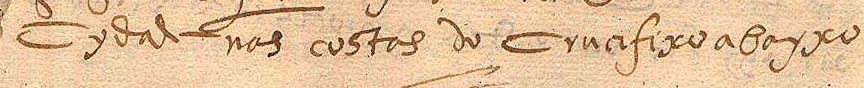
Cydade nas costas do Crucifixo abayxo
